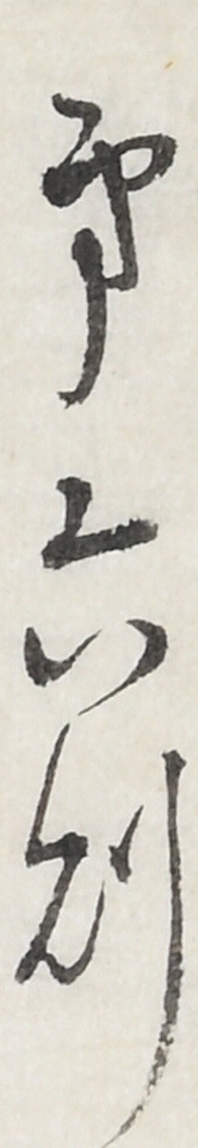第六則
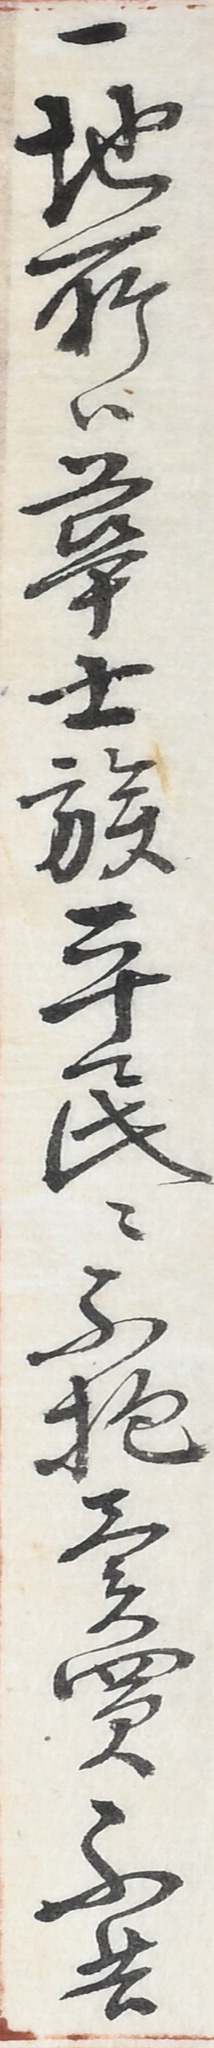一地所は華士族平民に不拘売買不苦

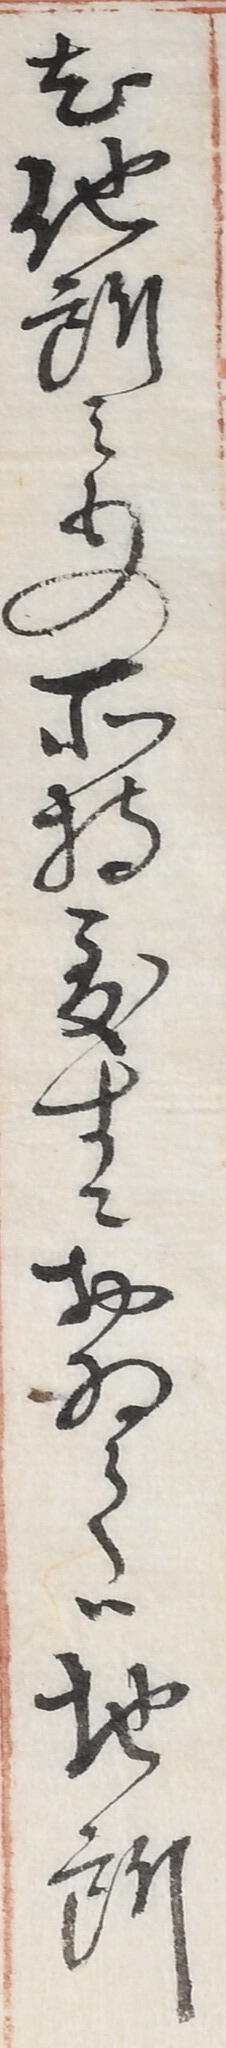尤他所之もの所持致すにおゐては地所
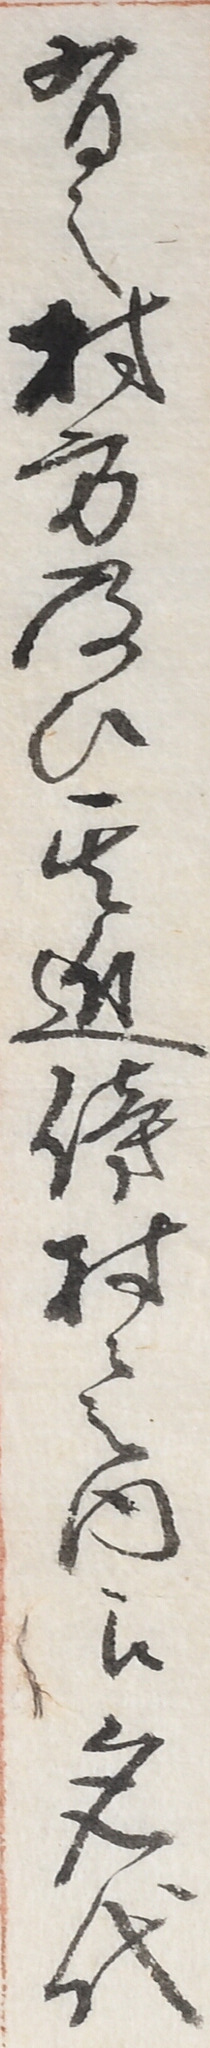有之村方及ひ其近傍村々之内え名代
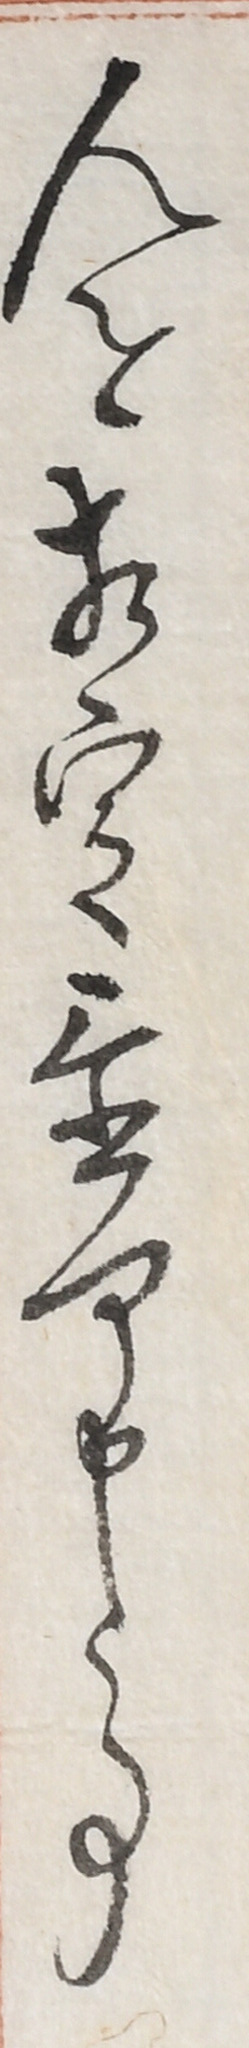人を相定置可申事
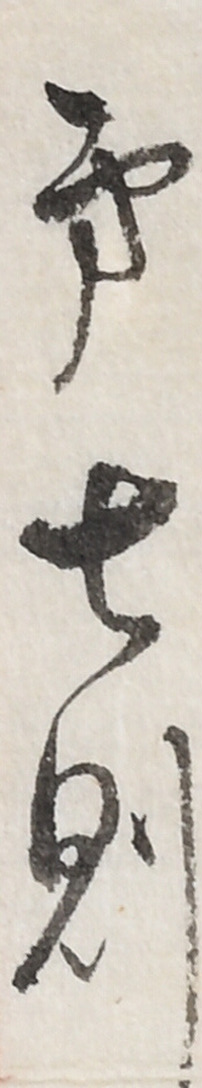第七則
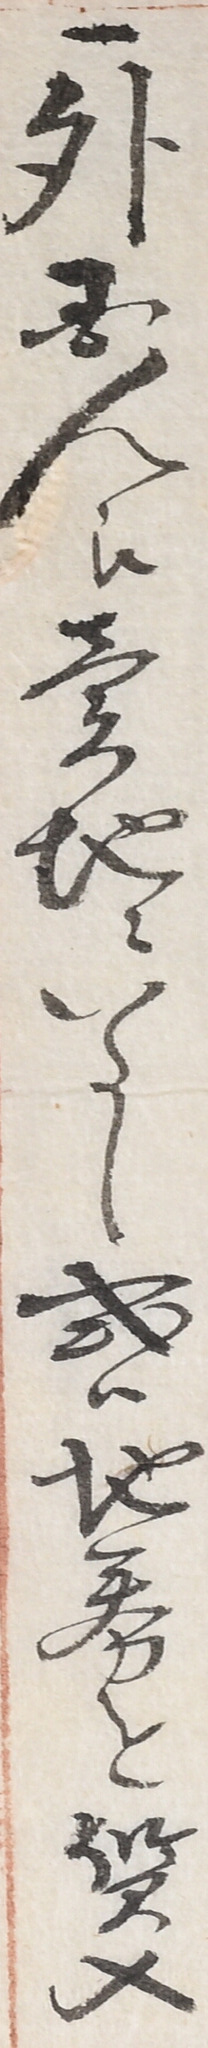一外国人え売地にいたし或は地券を質入
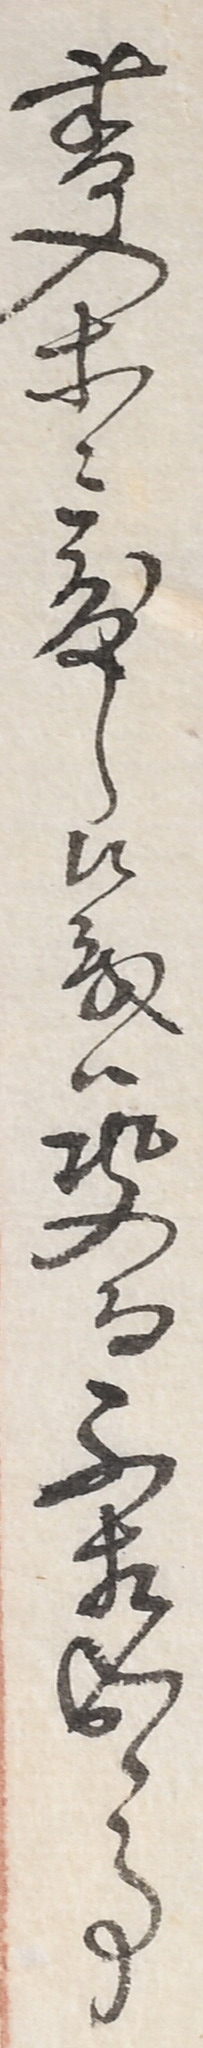書入等に致し候義は決而不相成候事
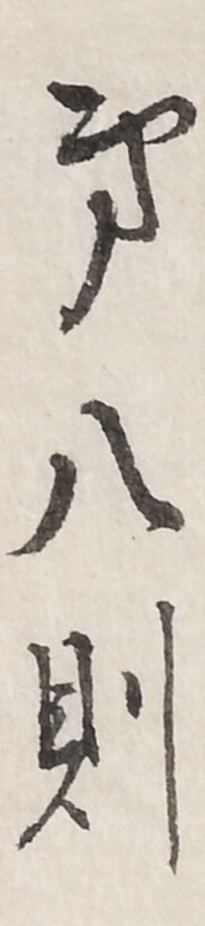第八則
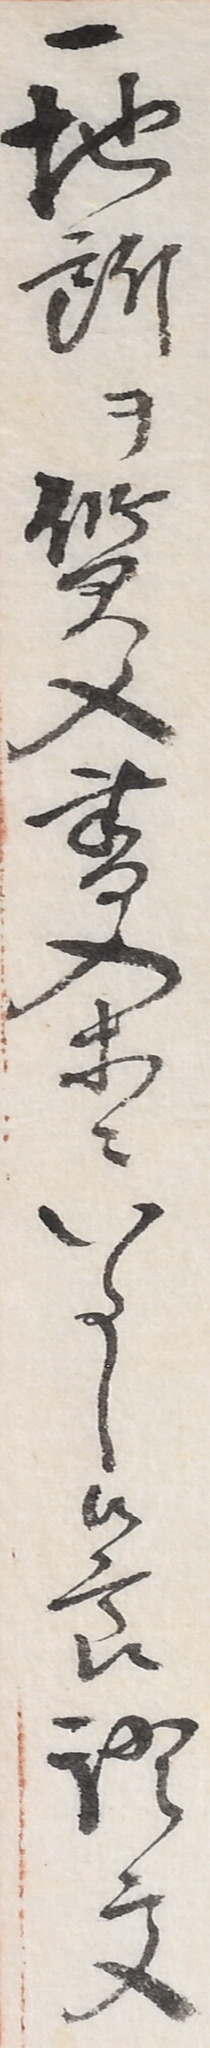一地所ヲ質入書入等にいたし候節証文
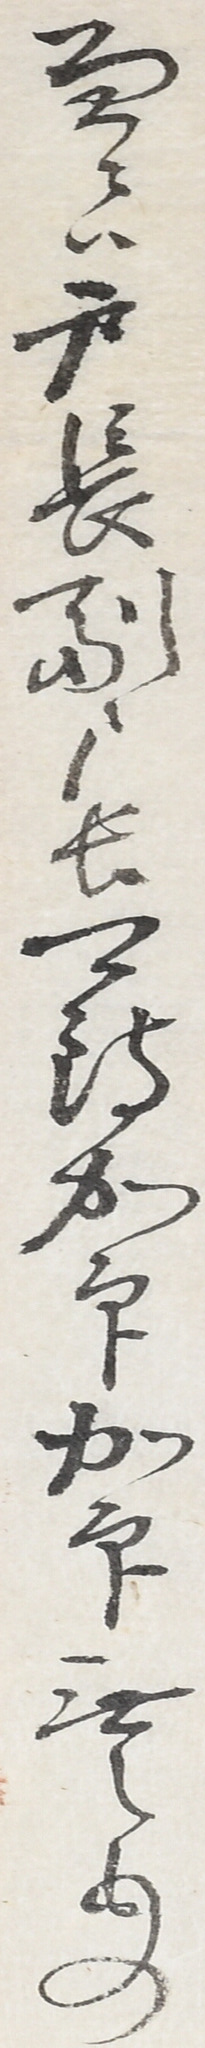面には戸長副戸長可致加印加印無之もの
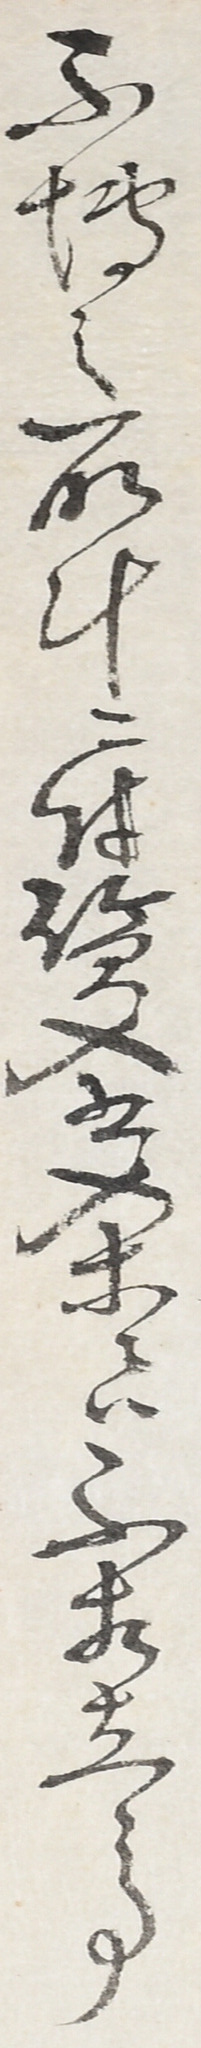不埒之取計に付質入書入等には不相立事
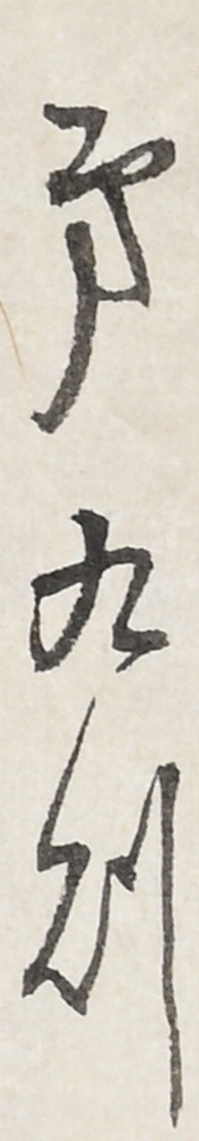第九則
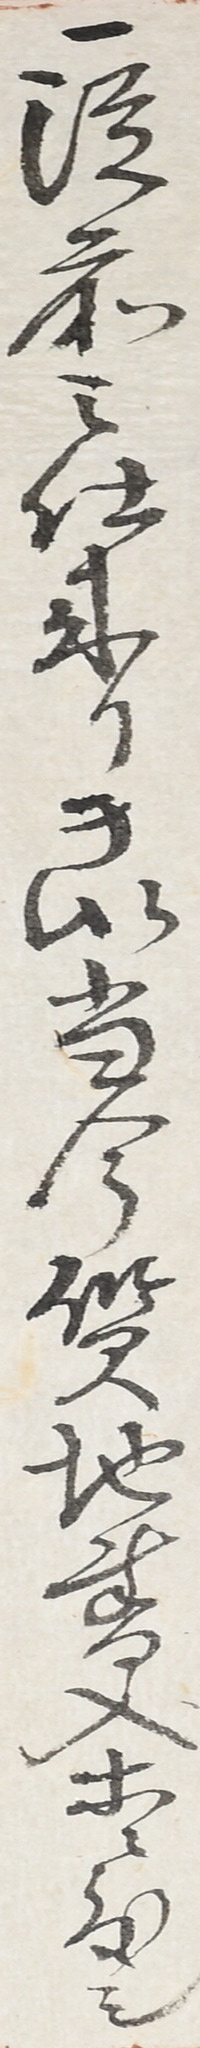一従前之仕来りを以当今質地書入等に至し
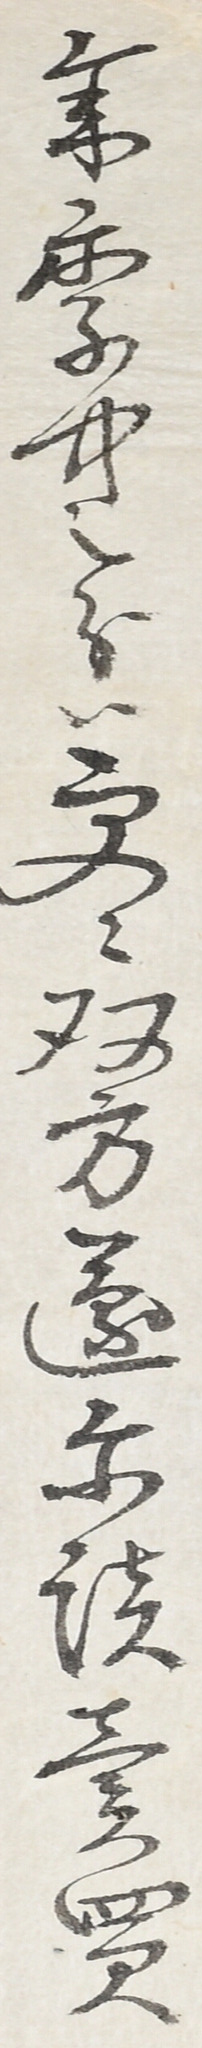歳季中之分は更に双方遂示談売買
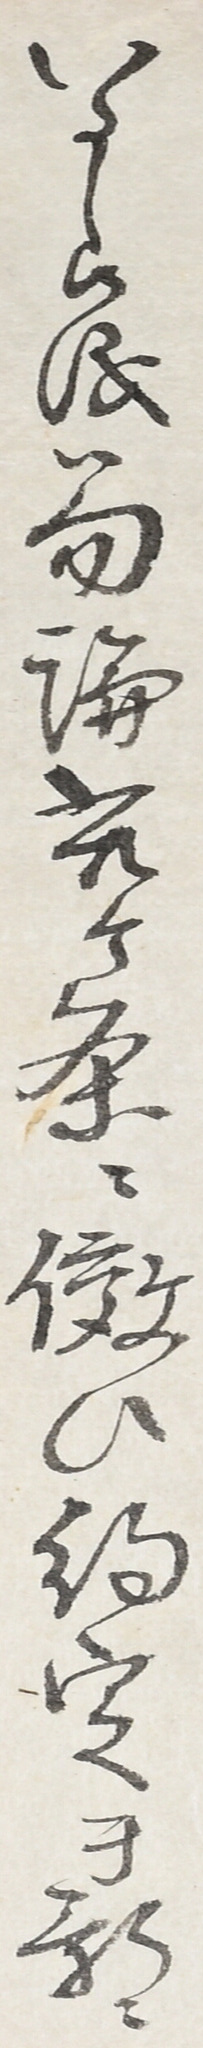いたし候儀は勿論此ケ条に倣ひ約定を新に
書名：壹番・御布告一式
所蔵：伊那市立高遠町図書館・合同会社AMANE
